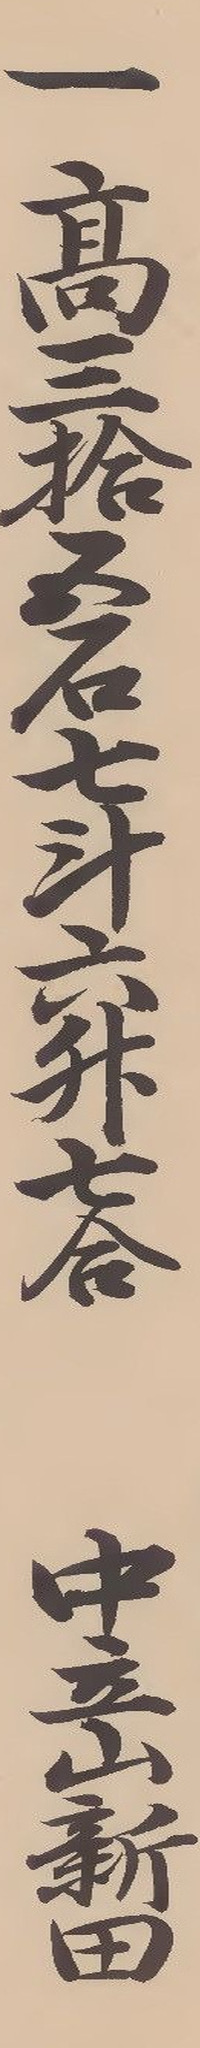一高三拾五石七斗六升七合中立山新田
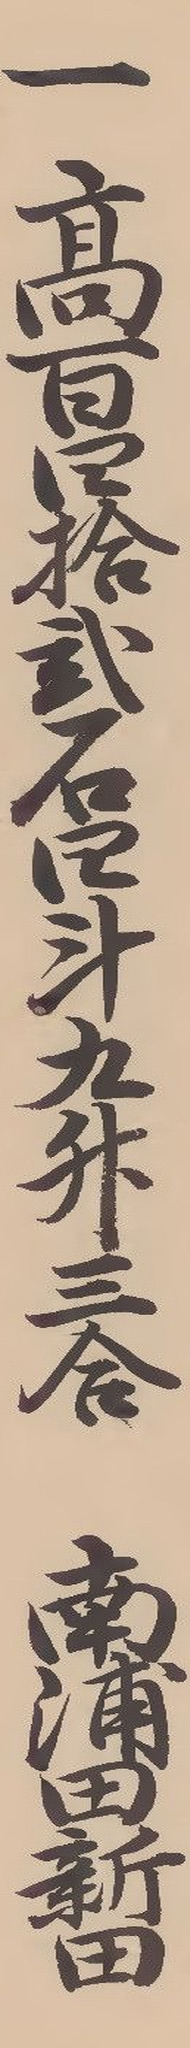一高百四拾弐石四斗九升三合南浦田新田

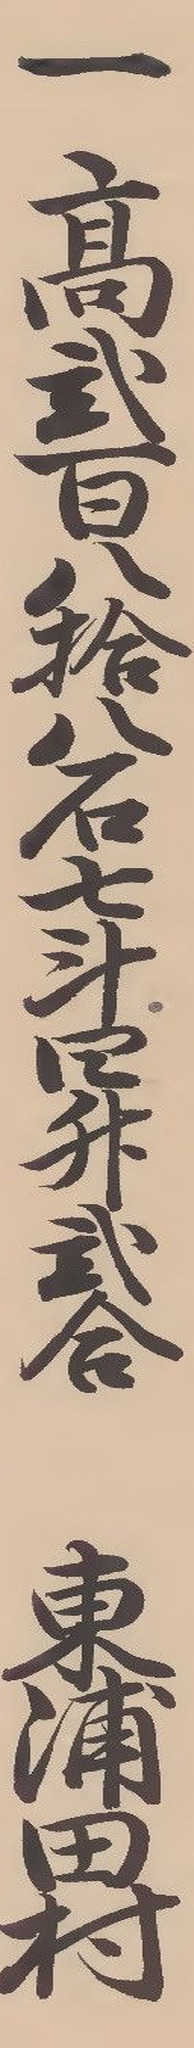一高弐百八拾八石七斗四升弐合東浦田村
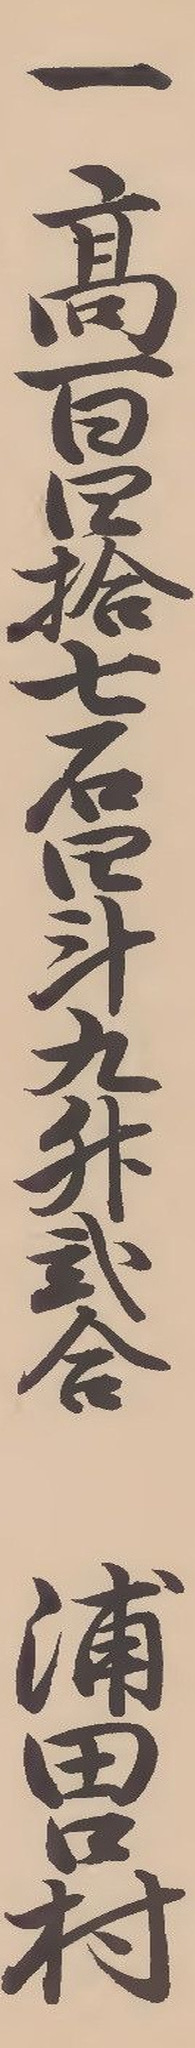一高百四拾七石四斗九升弐合浦田口村
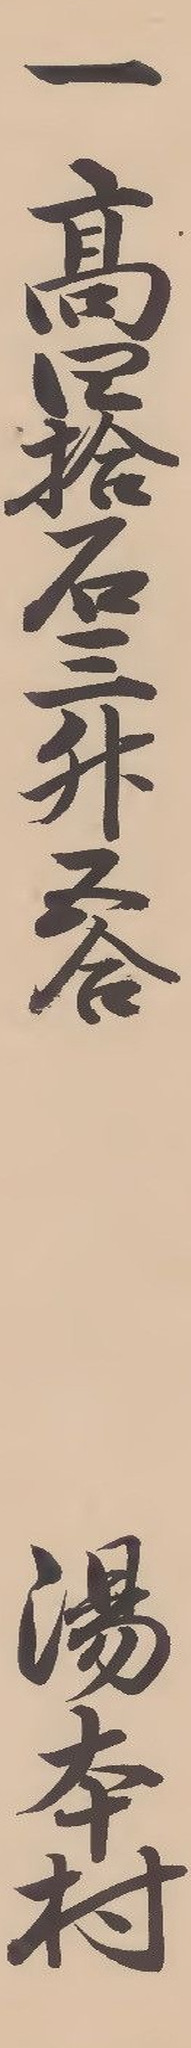一高四拾石三升五合湯本村
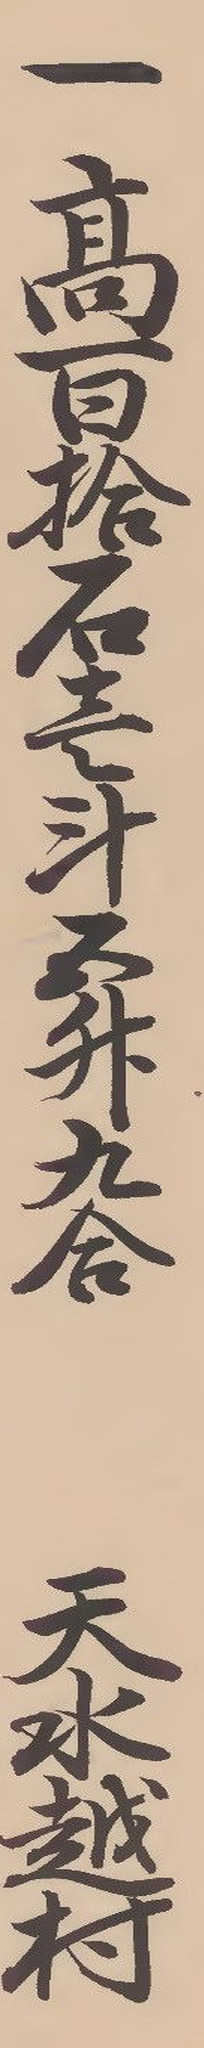一高百拾石壱斗五升九合天水越村
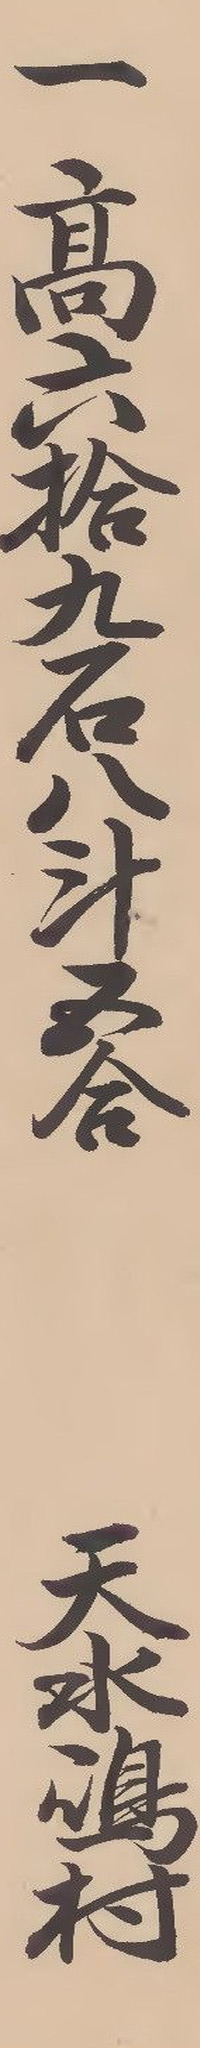一高六拾九石八斗五合天水島村
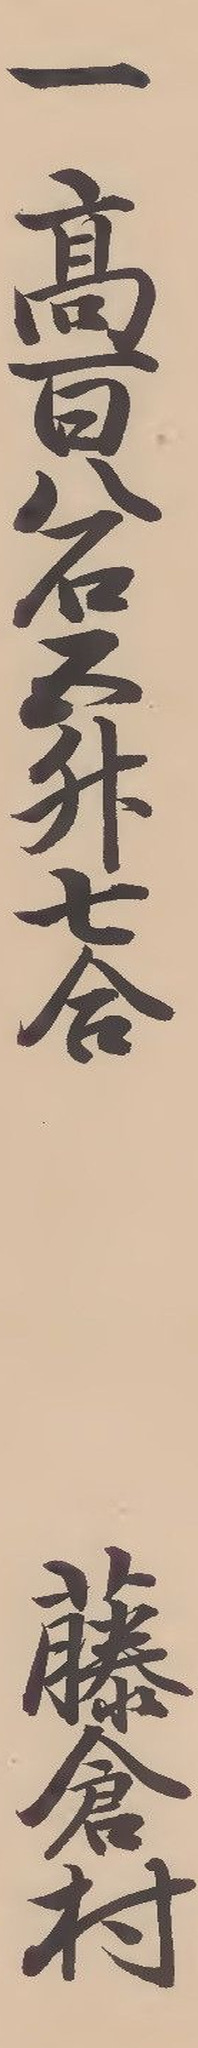一高百八石五升七合藤倉村
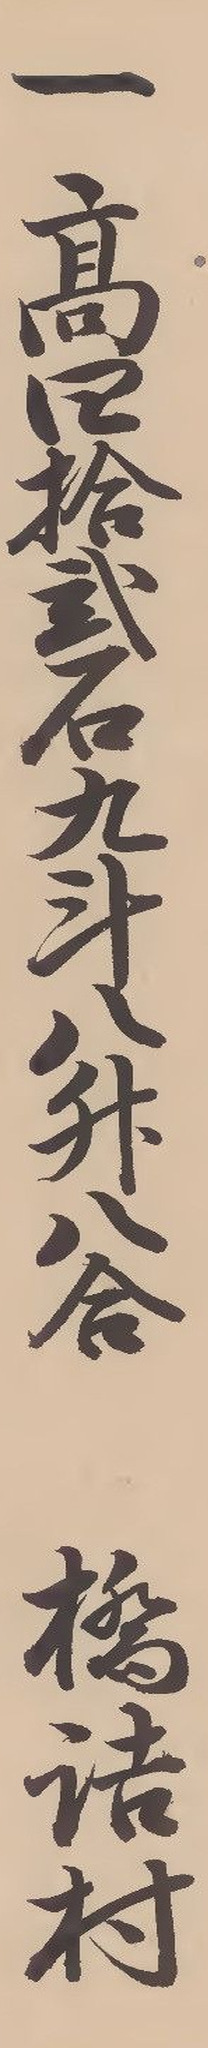一高四拾弐石九斗八升八合橋詰村
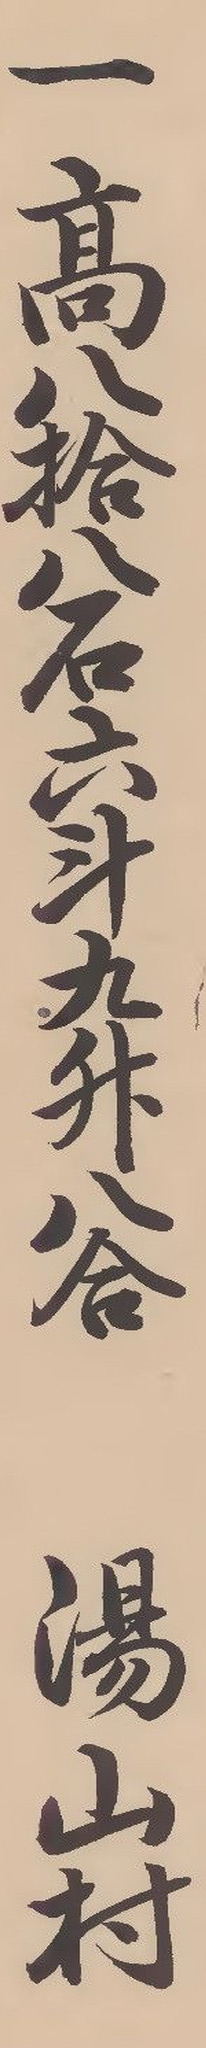一高八拾八石六斗九升八合湯山村

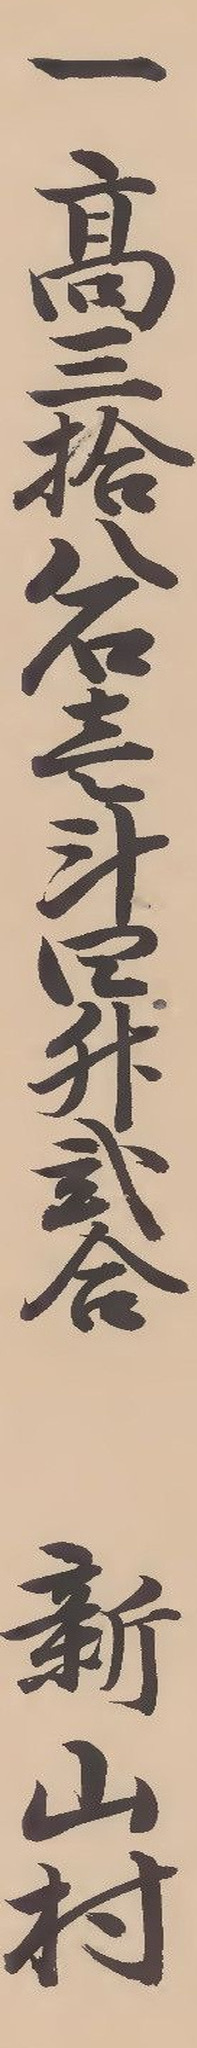一高三拾八石壱斗四升弐合新山村
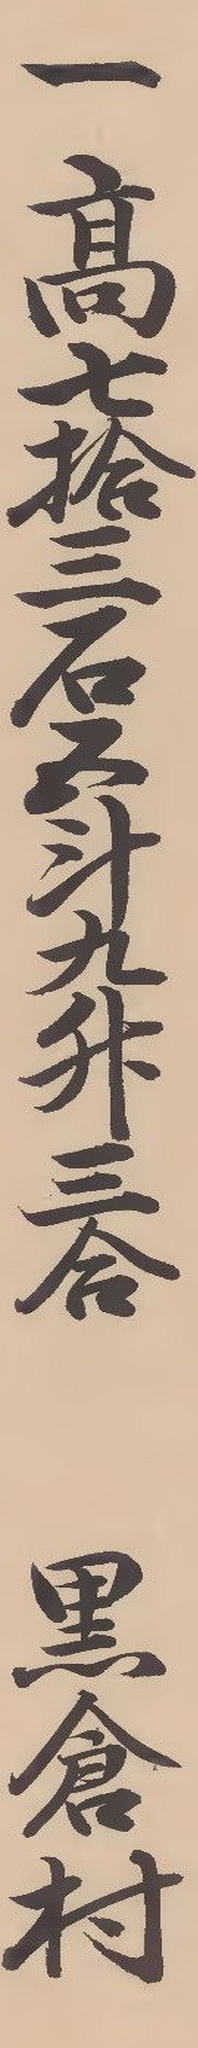一高七拾三石五斗九升三合黒倉村
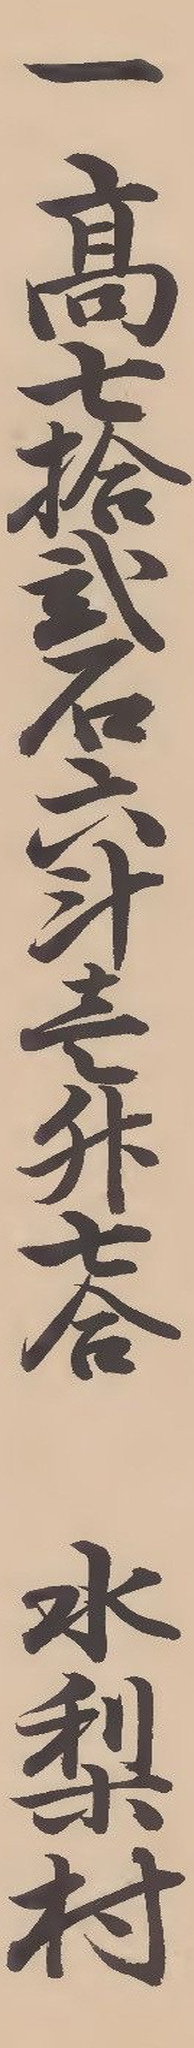一高七拾弐石六斗壱升七合水梨村
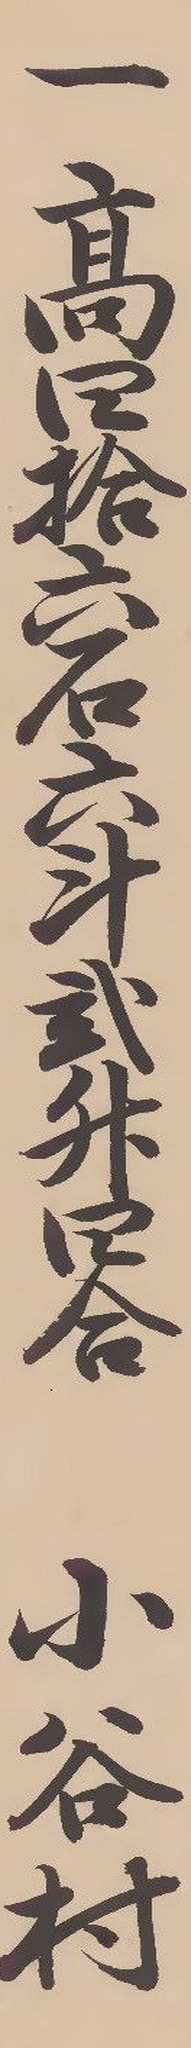一高四拾六石六斗弐升四合小谷村
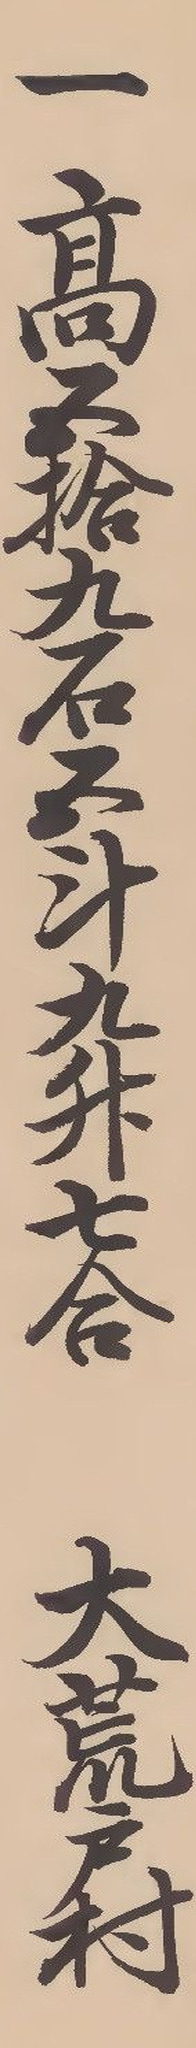一高五拾九石五斗九升七合大荒戸村
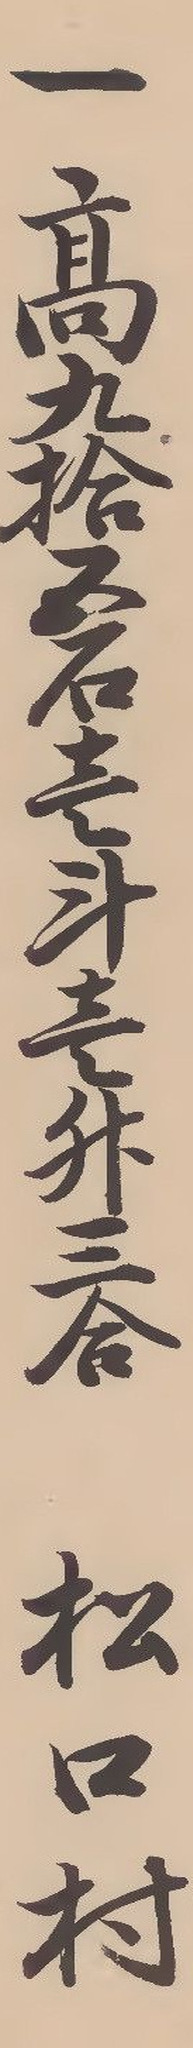一高九拾五石壱斗壱升三合松口村
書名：越後国郷帳　上
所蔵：国立公文書館 National Archives of Japan
